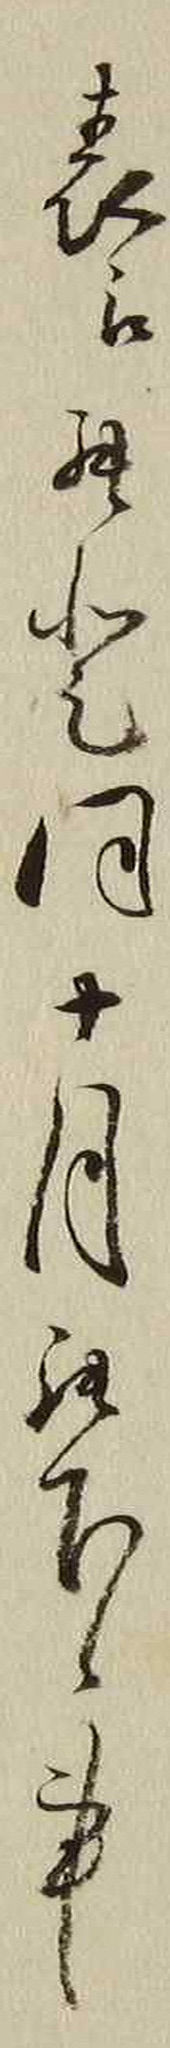表江罷登同十月罷下候事
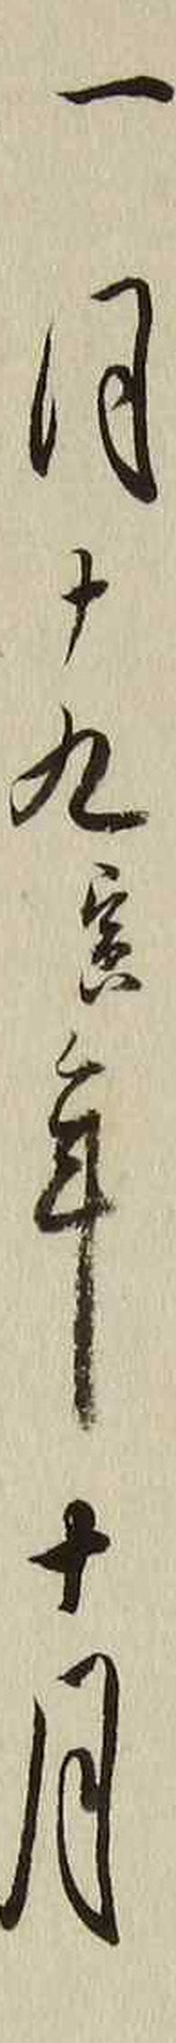一同十九寅年十月
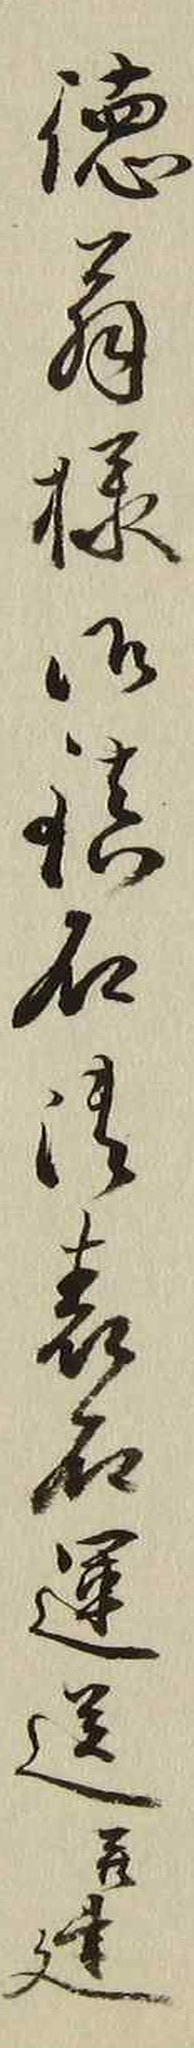徳翁様御鎮石御表石運送并建
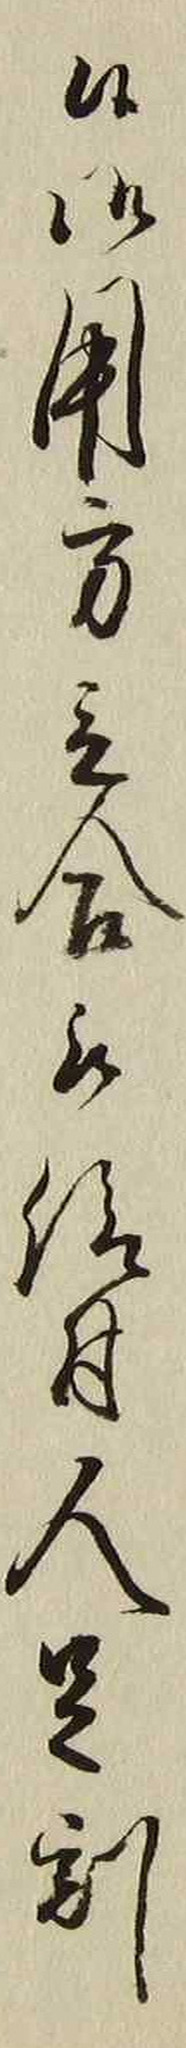候御用方立合被仰付人足割
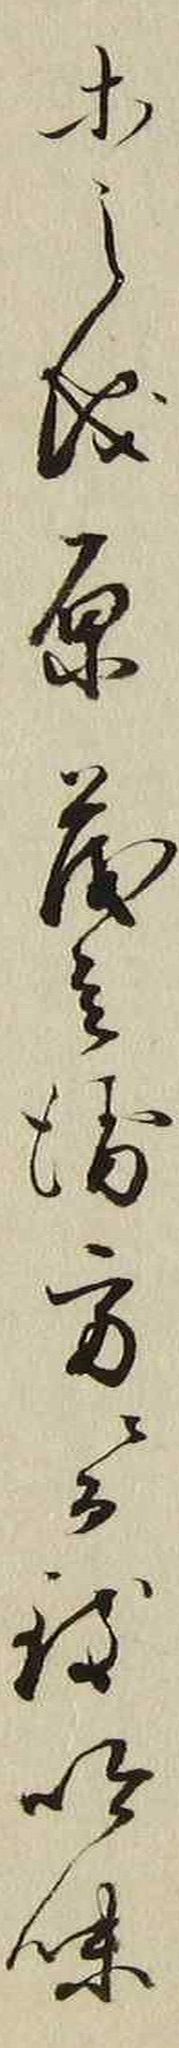等之儀原茂兵衛方ニ而致吟味
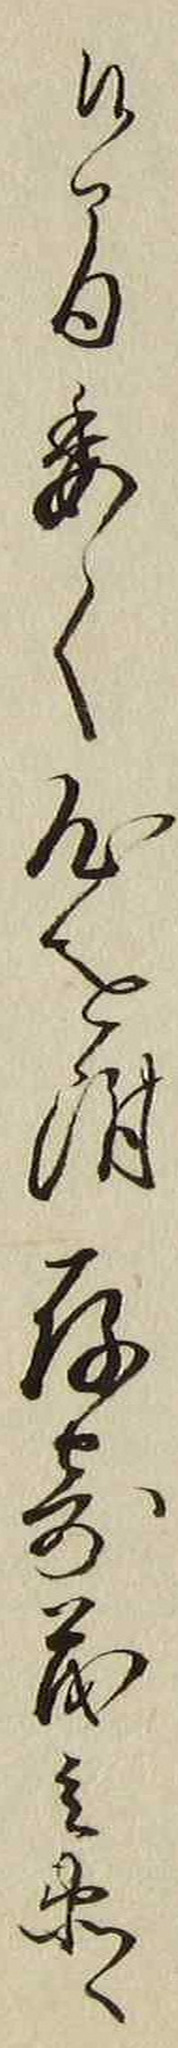候間委く心を附存寄茂兵衛へ
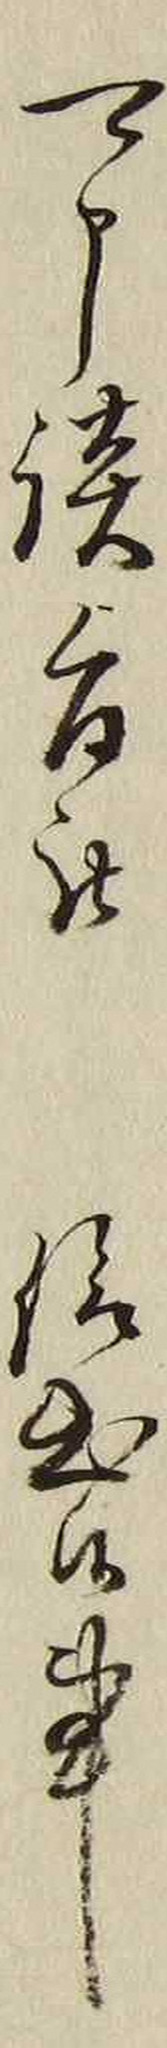可申談旨被被仰出候事
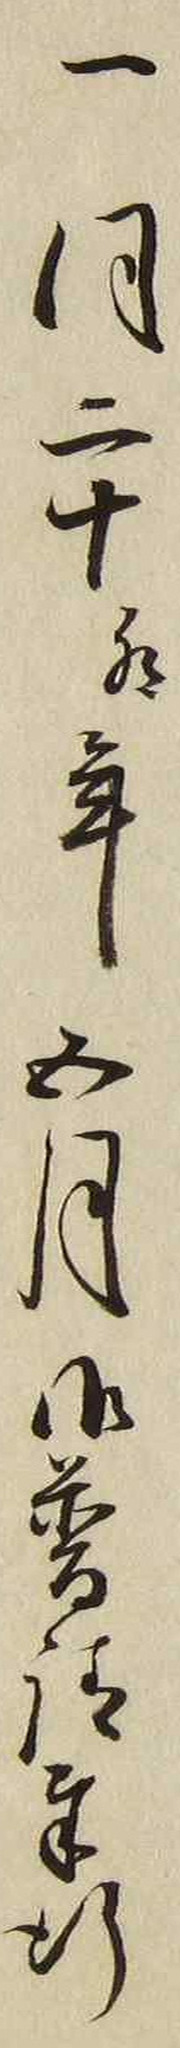一同二十卯年五月御普請奉行

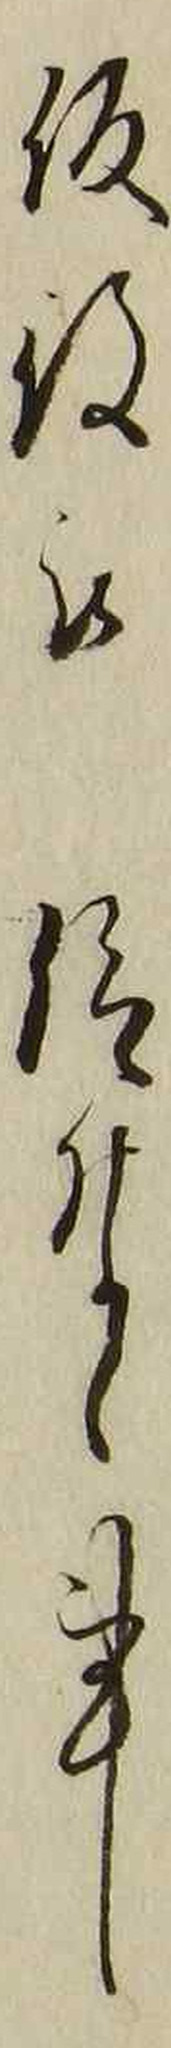仮役被仰付候事
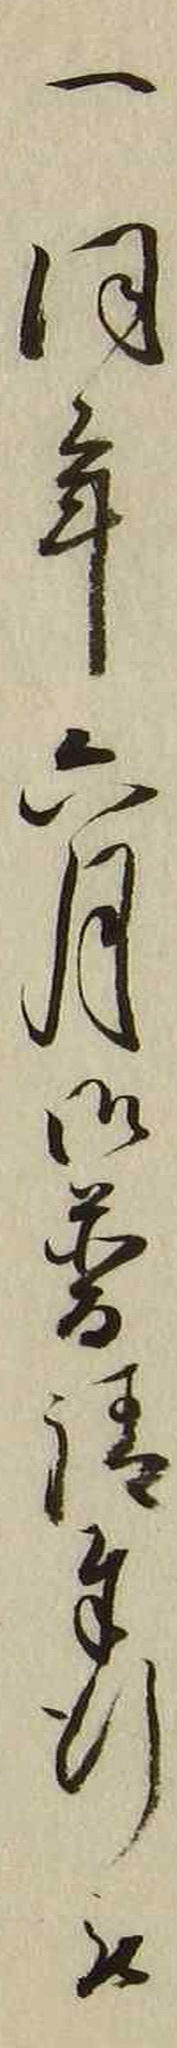一同年六月御普請奉行被
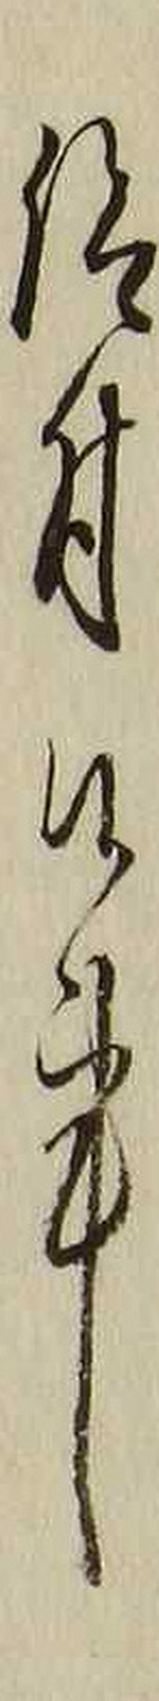仰付候事
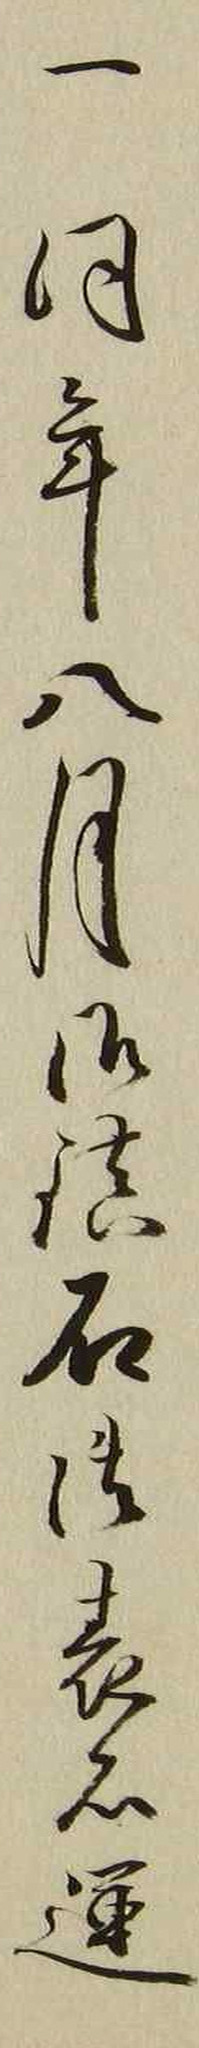一同年八月御鎮石御表石運
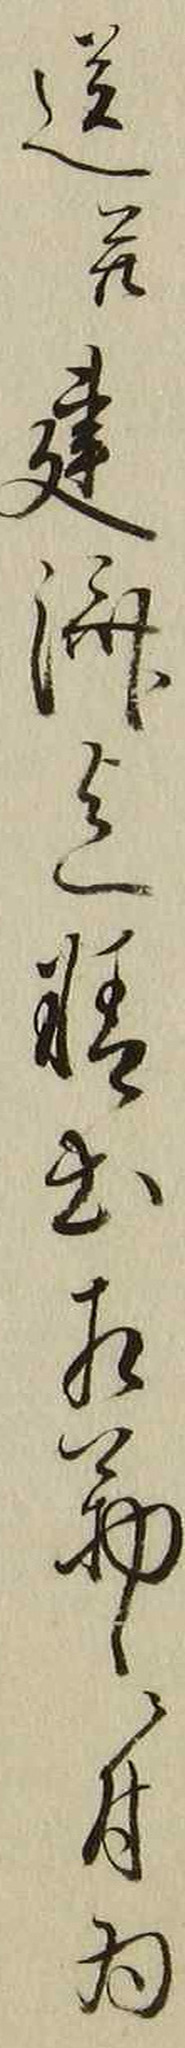送并建済迄精出相勤候ニ付為
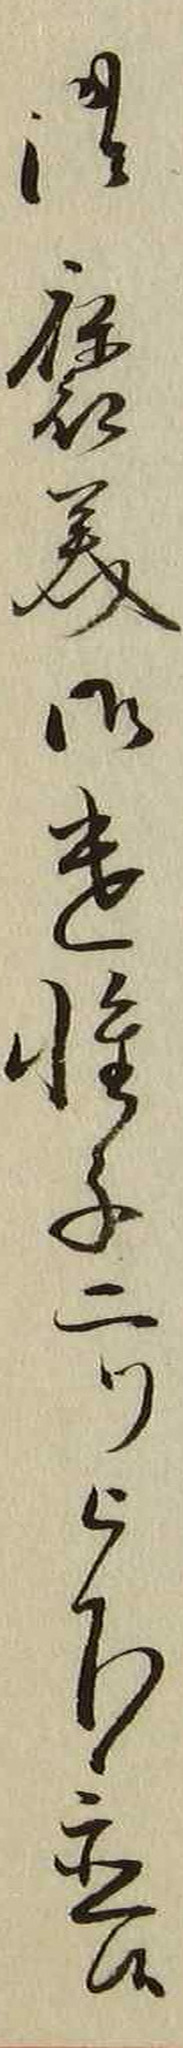御褒美御遣帷子二ツ被下置候
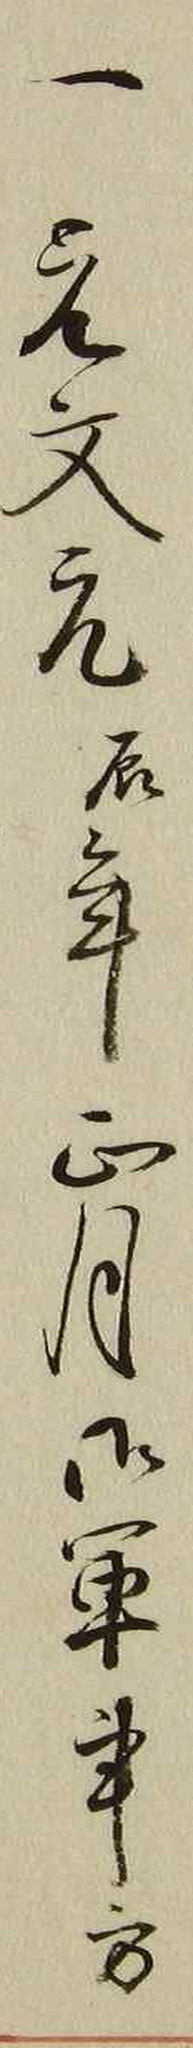一元文元辰年正月御軍事方
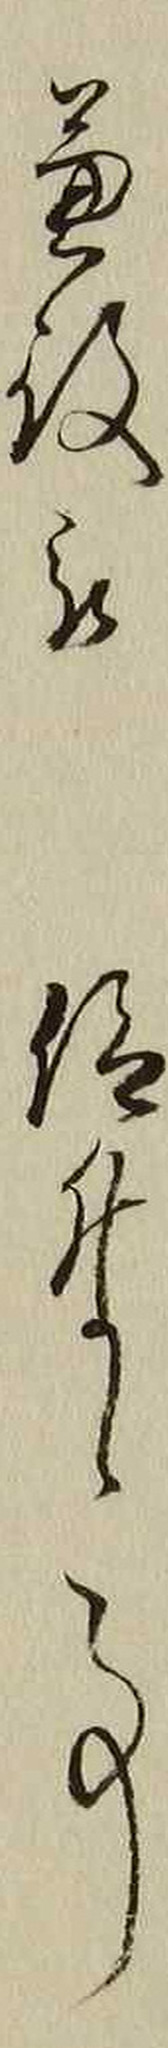兼役被仰付候事
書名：諸士系譜　巻之1　い之部1
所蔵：会津若松市立会津図書館
